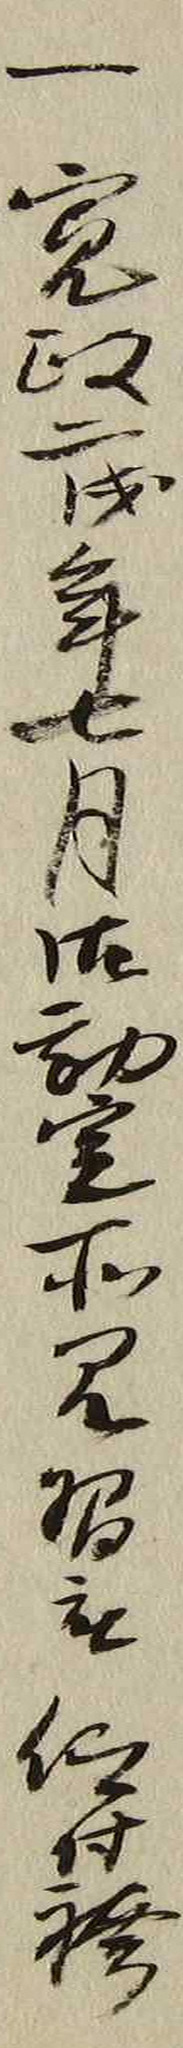一寛政二戌年七月御勘定所見習被仰付袴
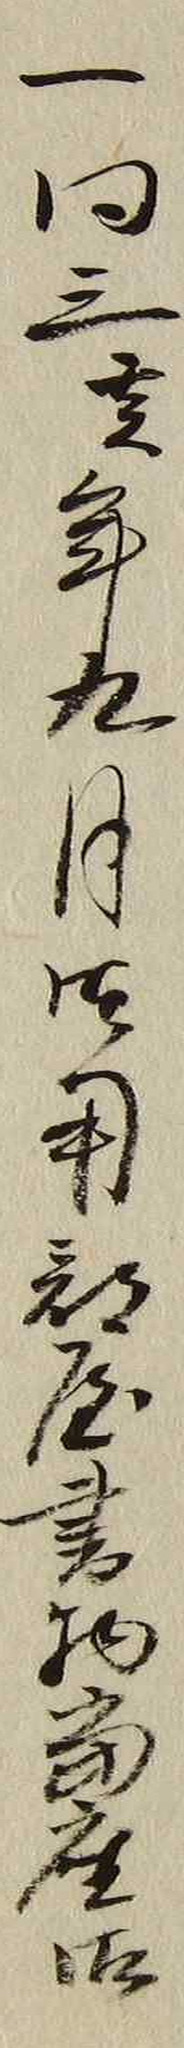一同三亥年九月御用部屋書物当座御
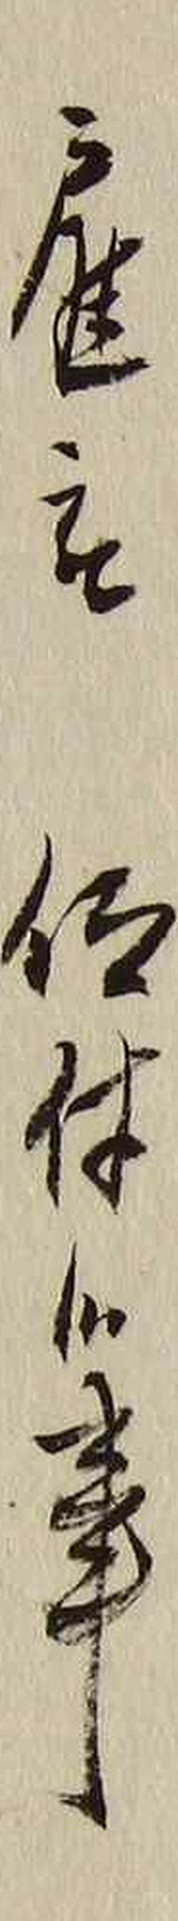雇被仰付候事
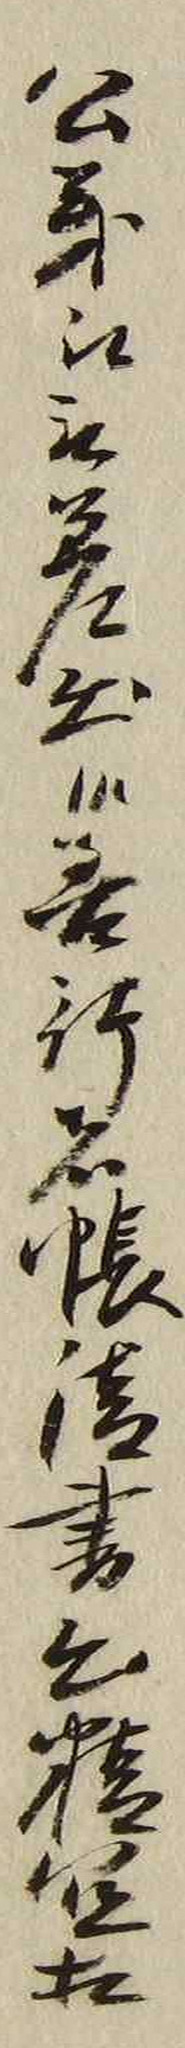公義江被差出候善行者帳清書出精宜相

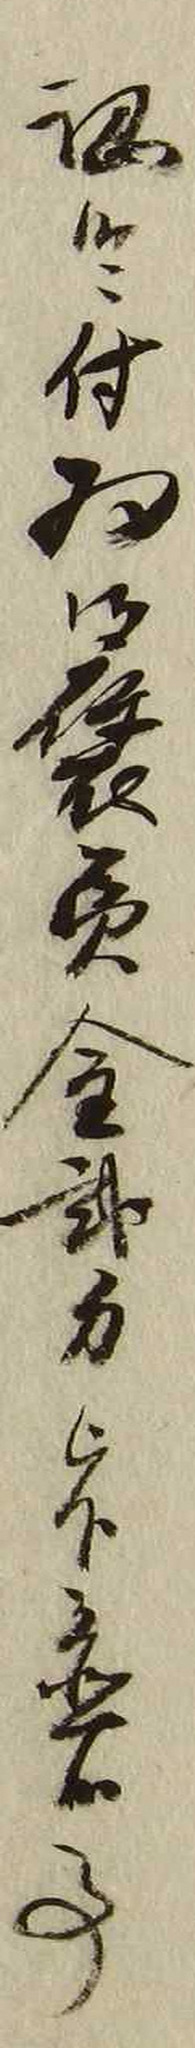認候付為御褒美金弐分被下置候事
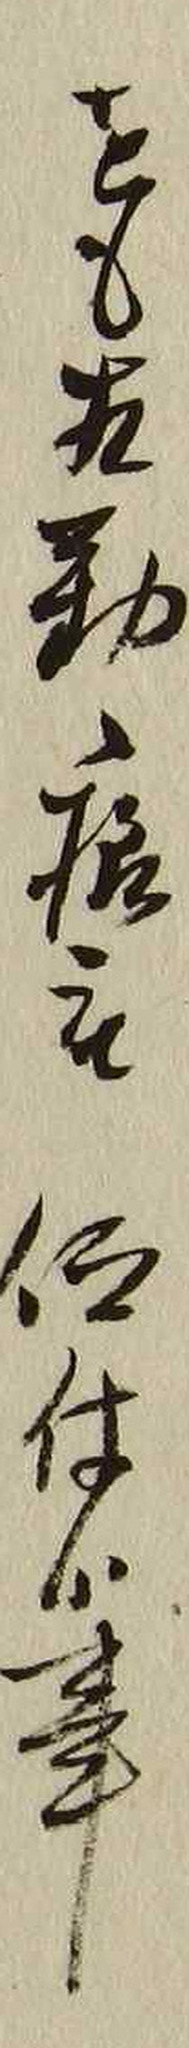をも相勤候様被仰付候事
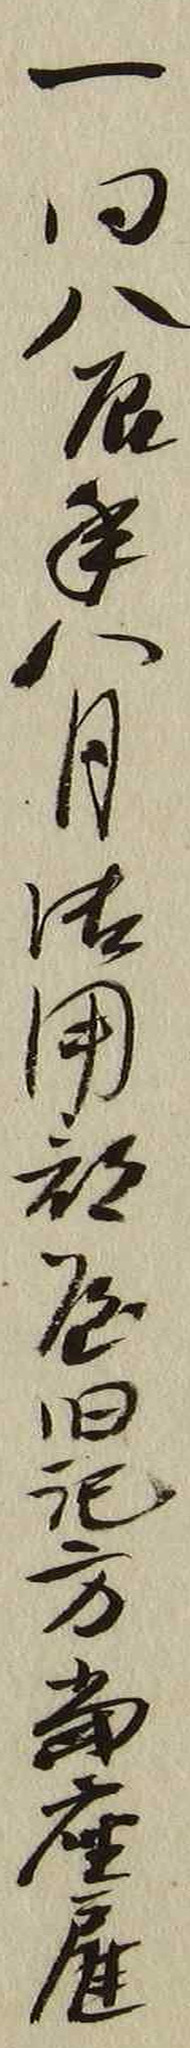一同八辰年八月御用部屋旧記方当座雇
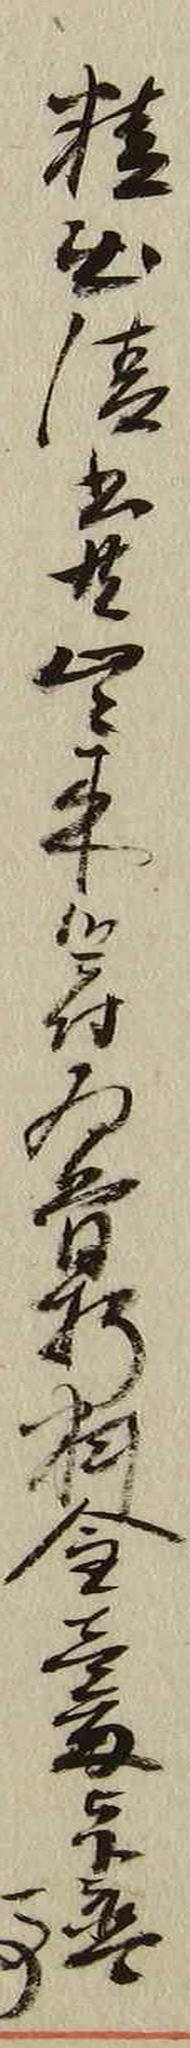精出清書共出来候付為骨折料金壱両被下置候事
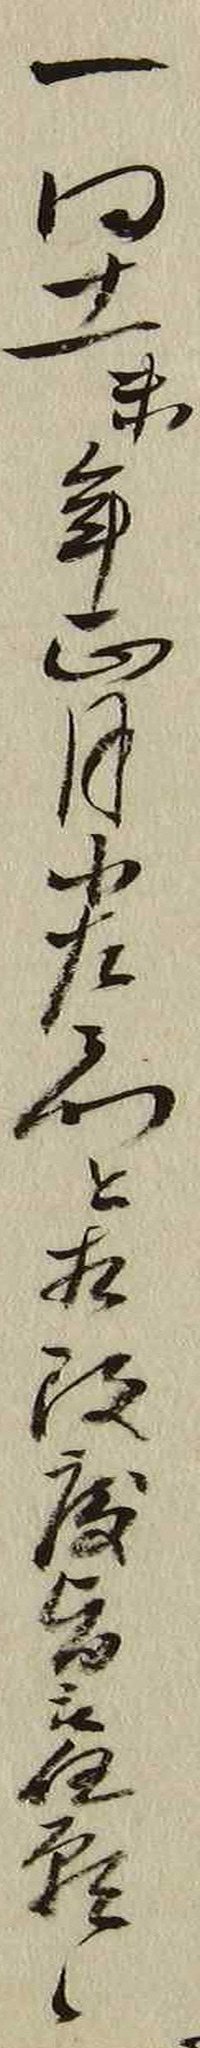一同十一未年正月小左エ門と相改度旨被任願候
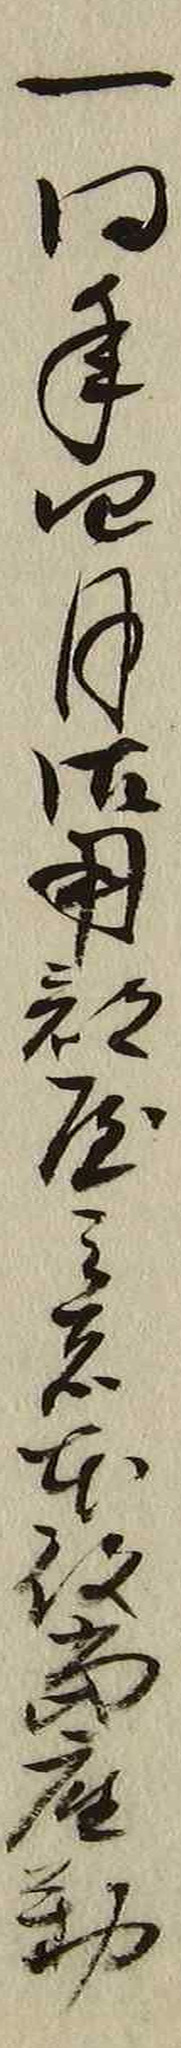一同年四月御用部屋之者本役当座勤
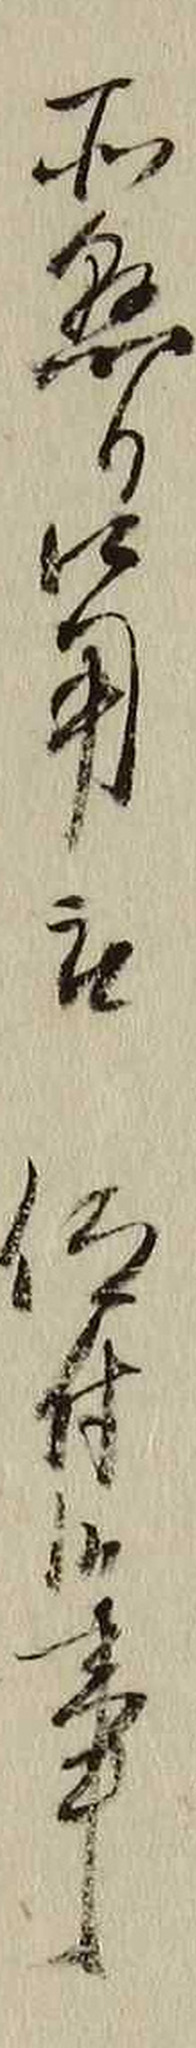所懸り御用被仰付候事
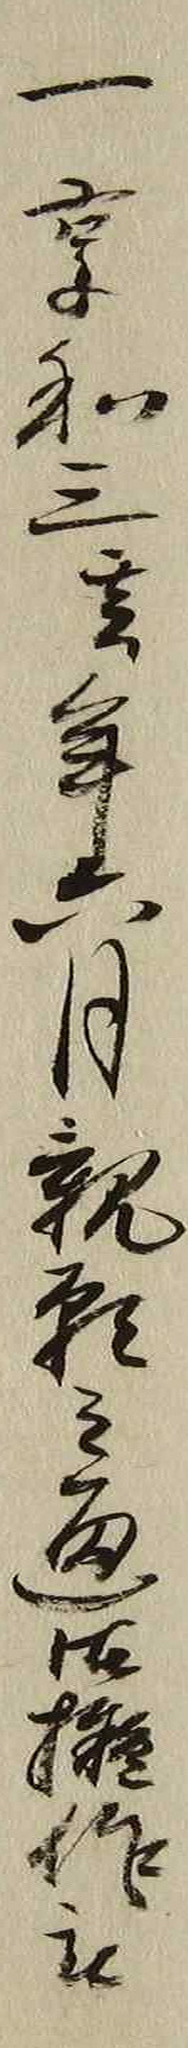一享和三亥年六月親願之通御擬作被
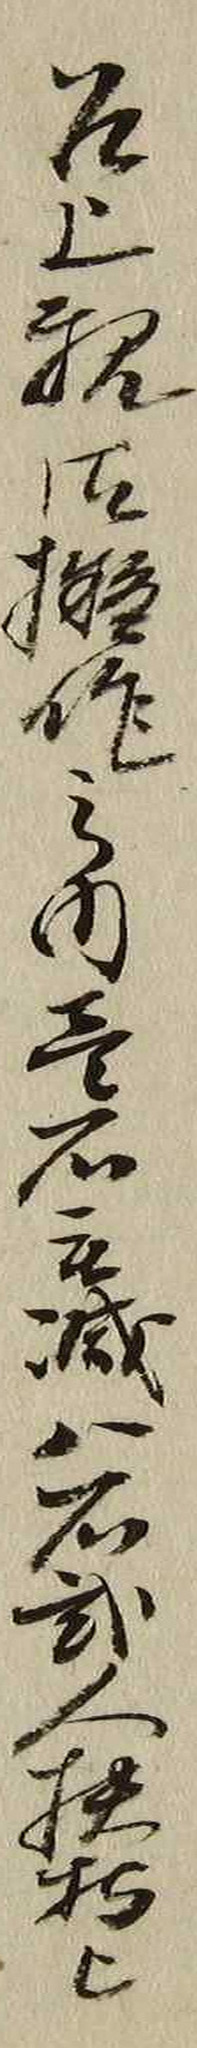召上親御擬作之内壱石被減八石弐人扶持被
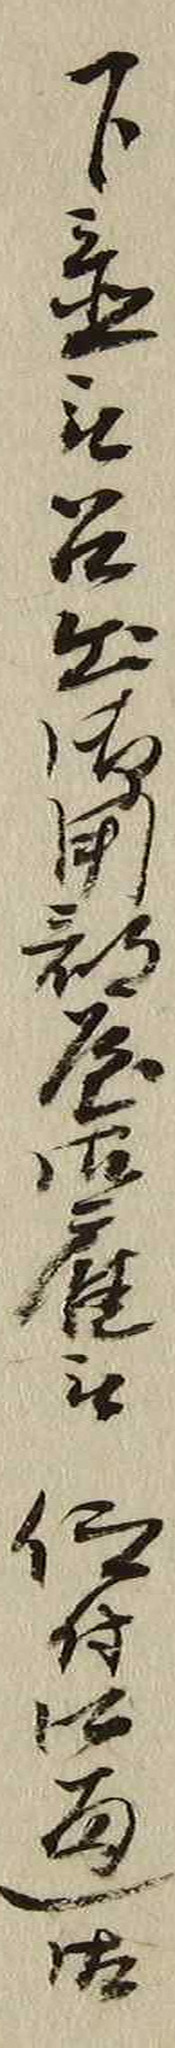下置被召出御用部屋御雇被仰付御通御
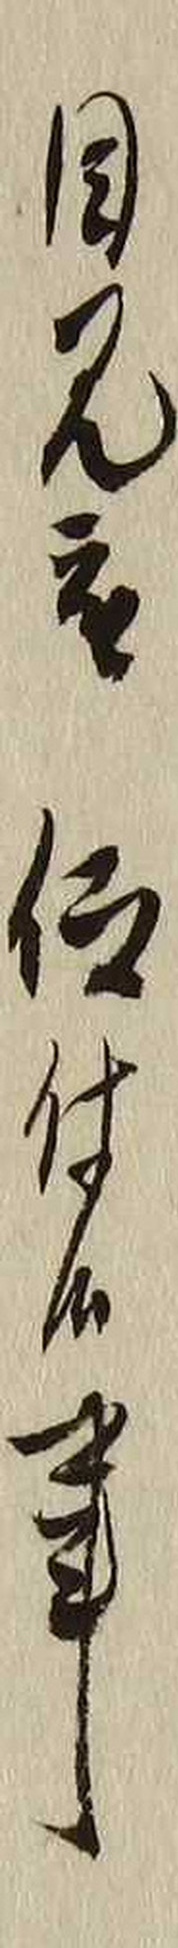目見被仰付候事
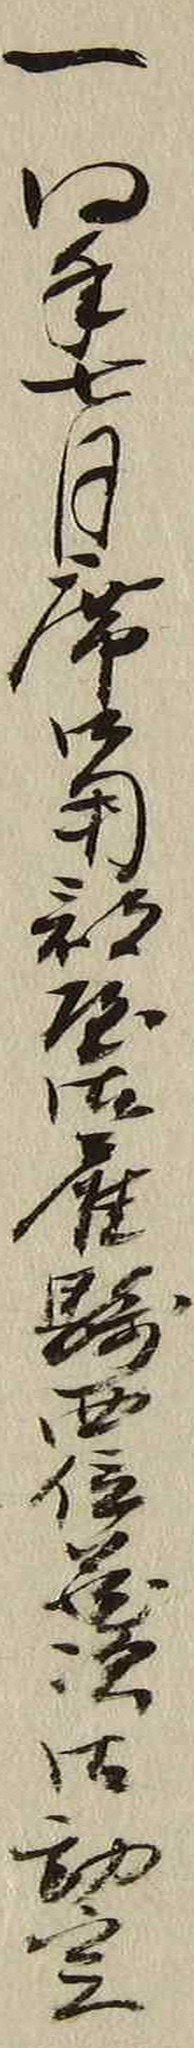一同年七月席御用部屋御雇騎西位蔵次御勘定
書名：諸士系譜　巻之350　せ之部1冊全
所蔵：会津若松市立会津図書館
